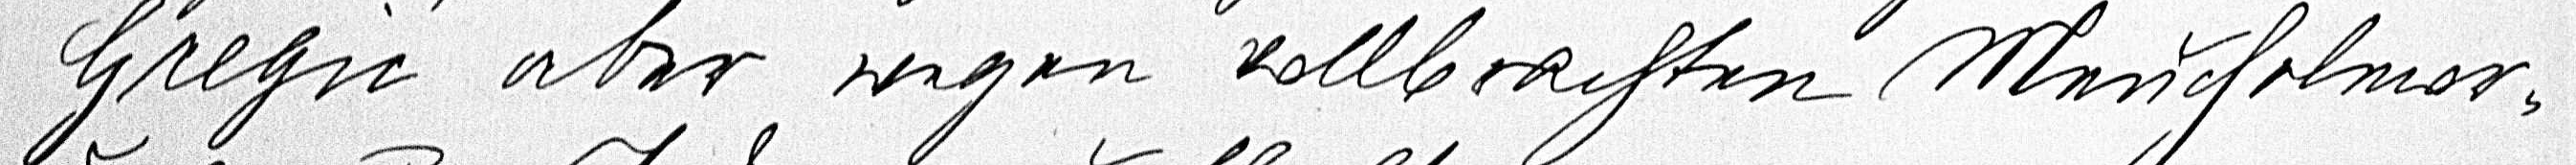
Gregić aber wegen vollbrachten Meuchelmor¬
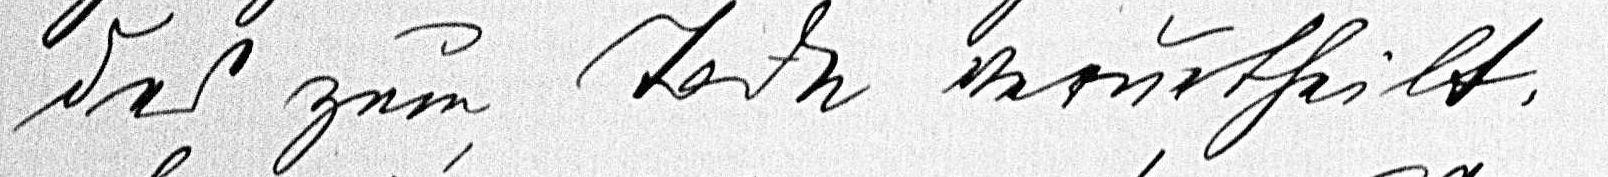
des zum Tode verurtheilt.
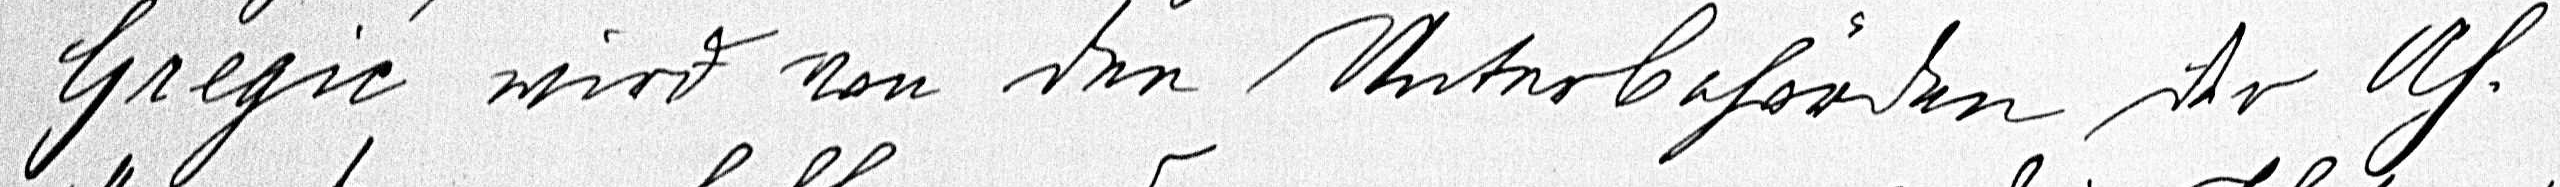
Gregić wird von den Unterbehörden der Ah
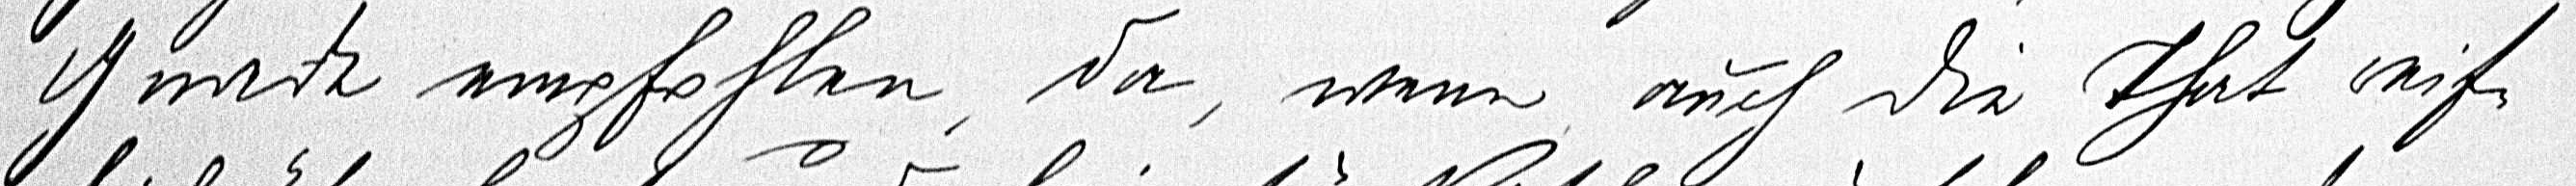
Gnade empfohlen, da, wenn auch die That reif¬
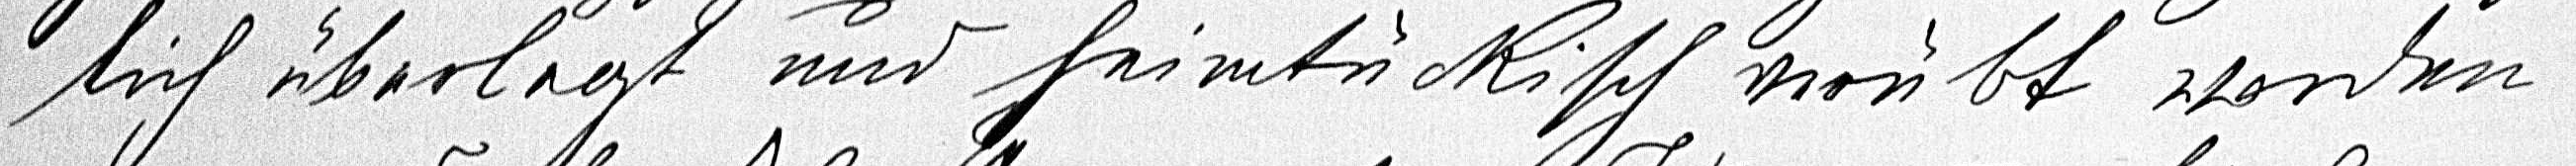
lich überlegt und heimtückisch verübt worden
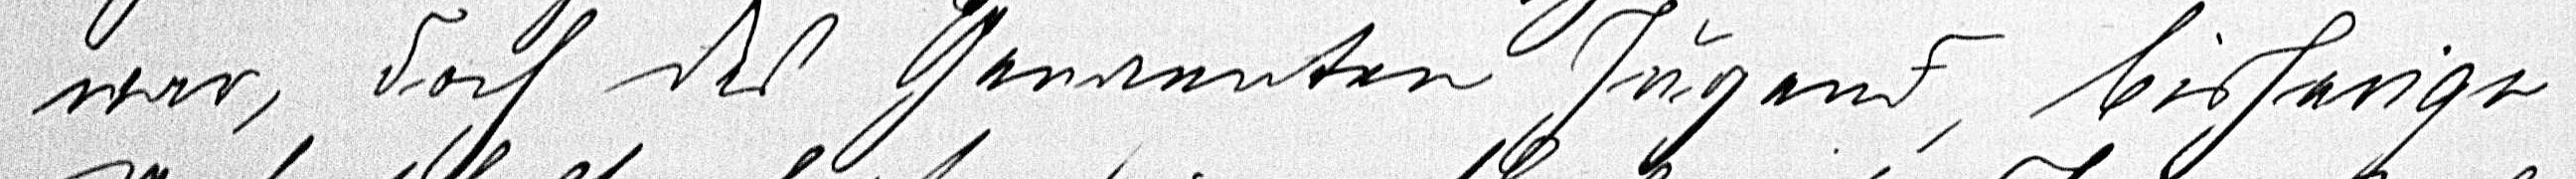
war, doch des Genannten Jugend, bisherige
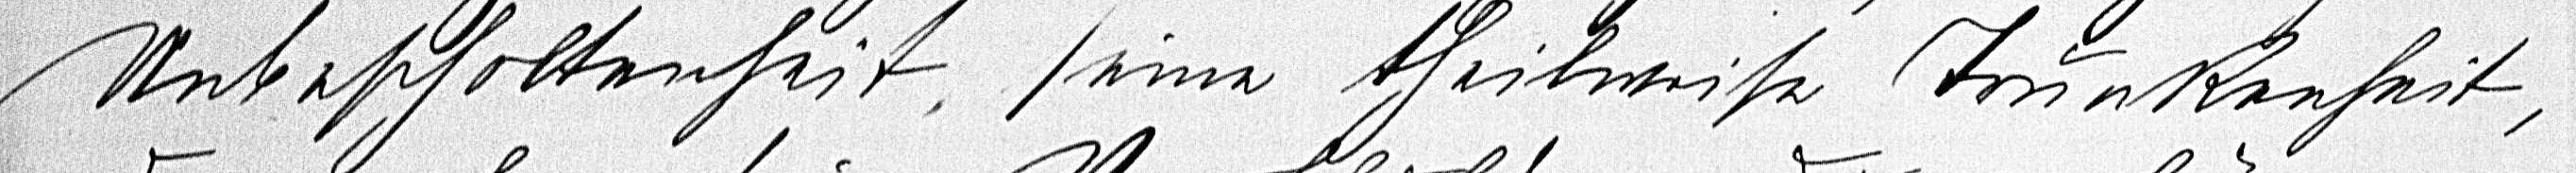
Unscholtenheit, seine theilweise Trunkenheit,
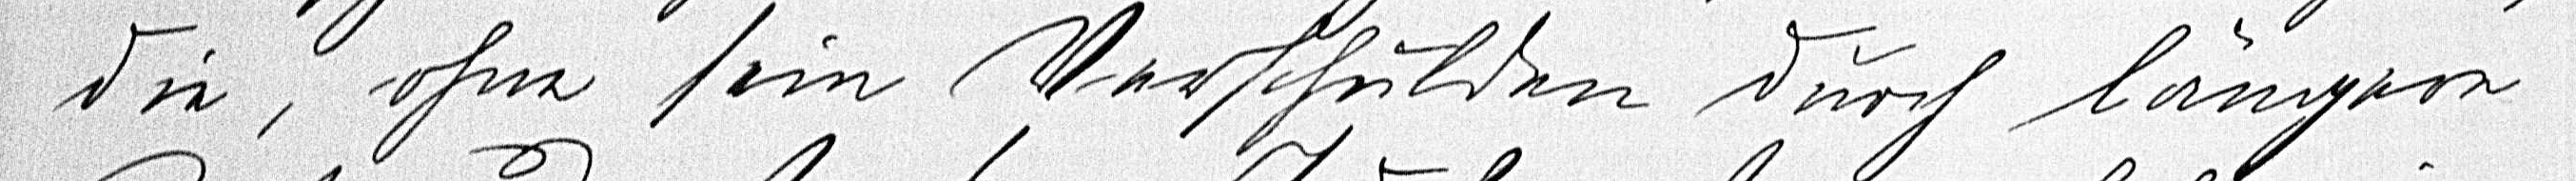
die, ohne sein Verschulden durch längere
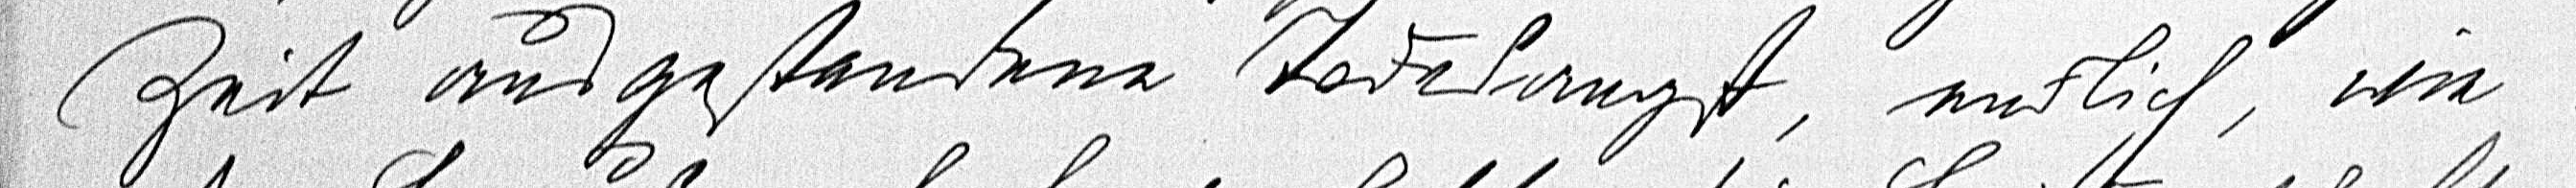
Zeit ausgestandene Todesangst, endlich wie
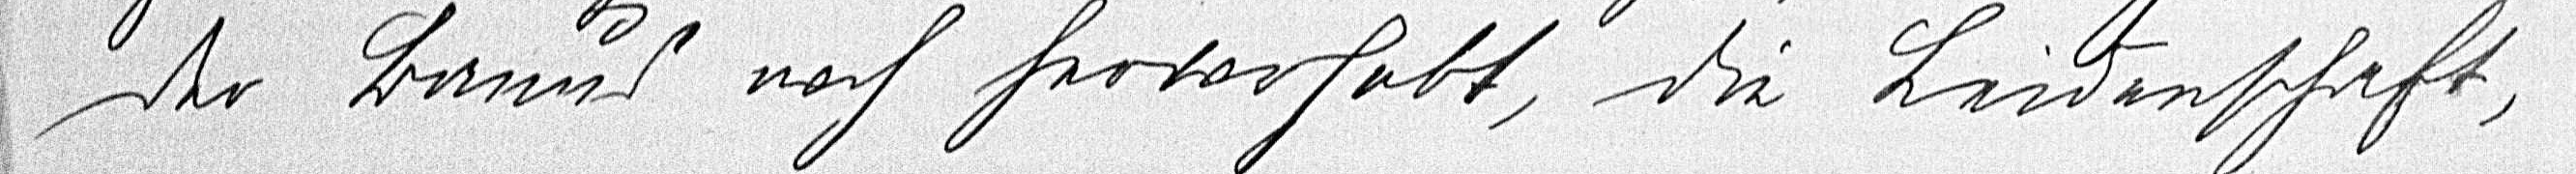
der Banus noch hervorhebt, die Leidenschaft,
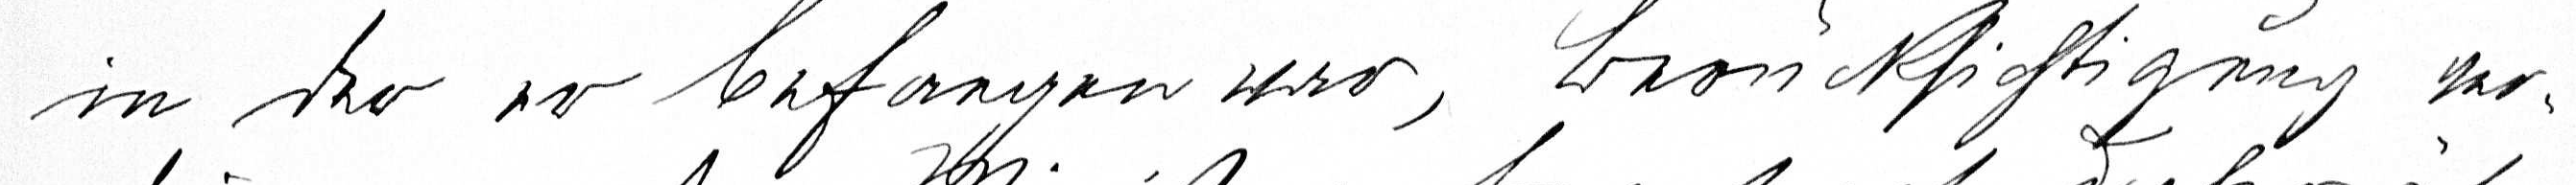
in der er befangen war, Berücksichtigung ver¬
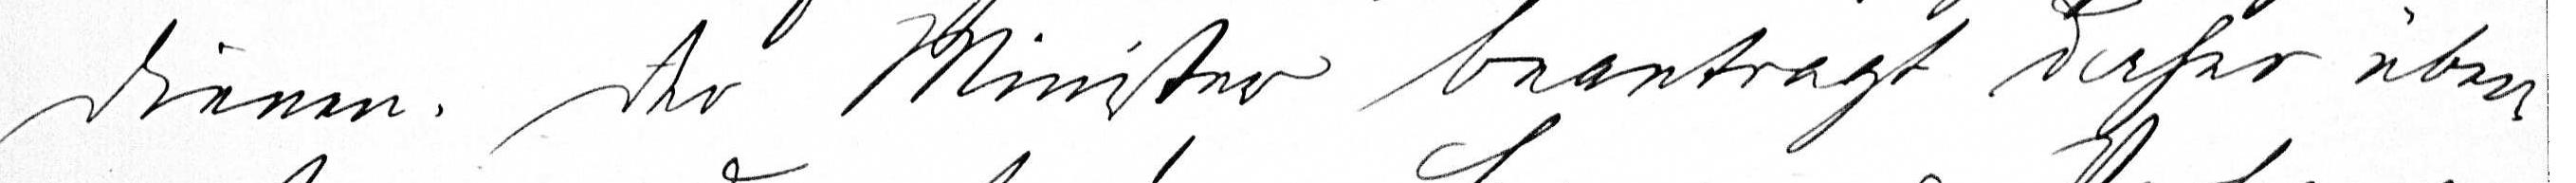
dienen. Der Minister beantragt daher über¬
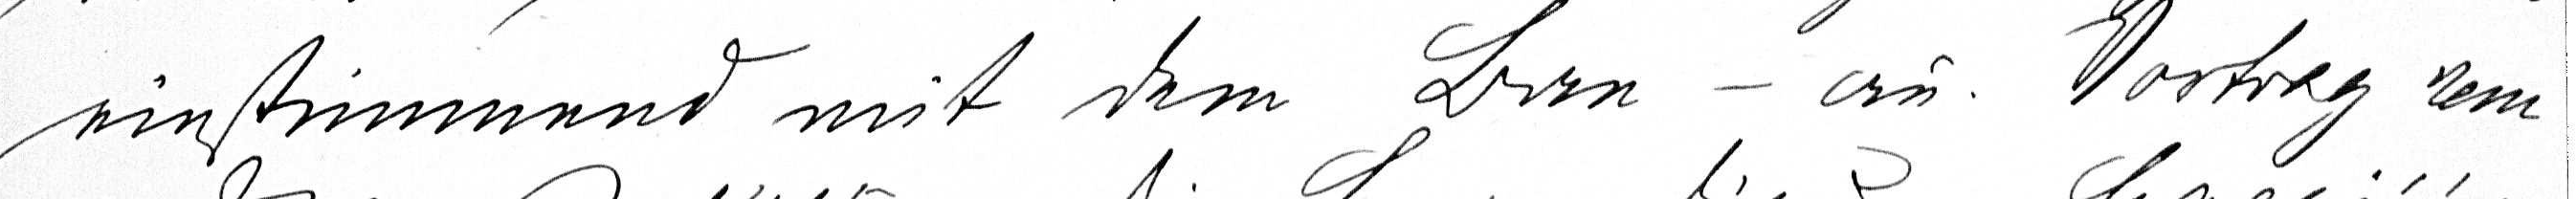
einstimmend mit dem Ban – au. Vortrag vom
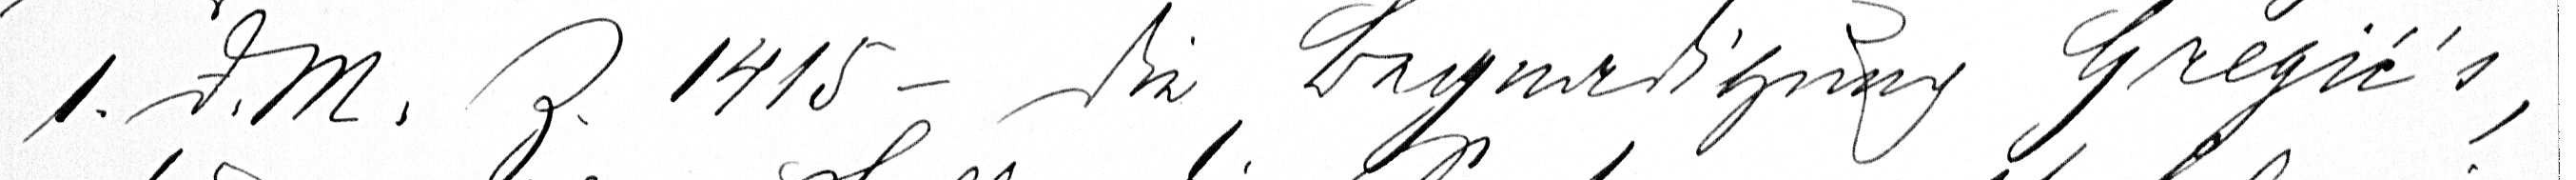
1.d.M. Z 1415 – die Begnadigung Gregić’s
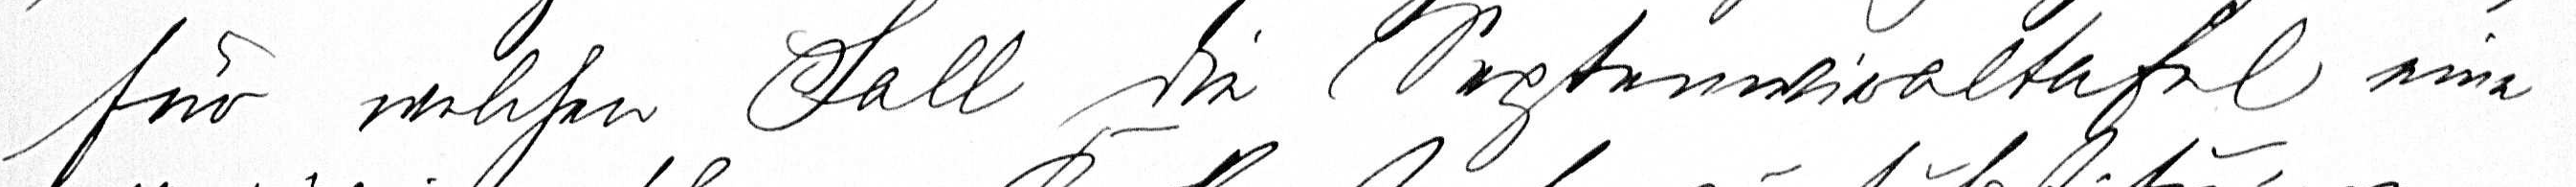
für welchen Fall die Septemviraltafel eine
